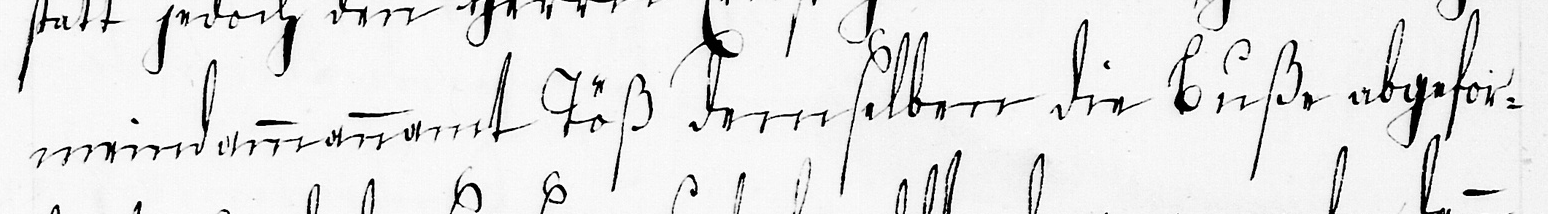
meindeammannamt Töß demselben die Buße abgefor¬
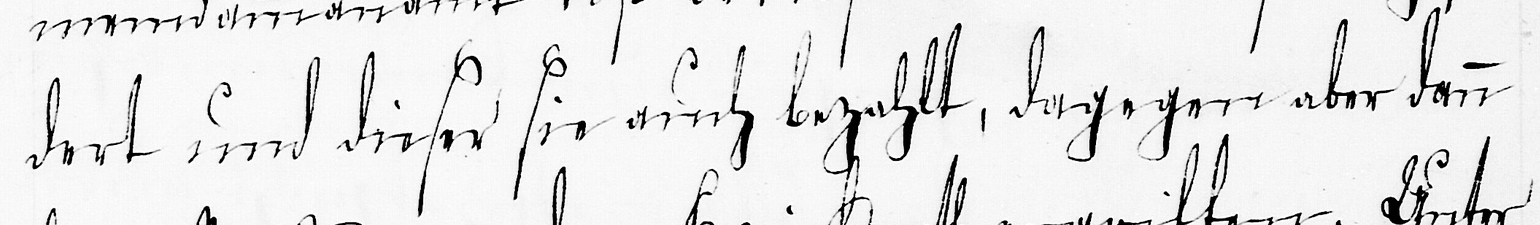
dert und dieser sie auch bezahlt, dagegen aber dann
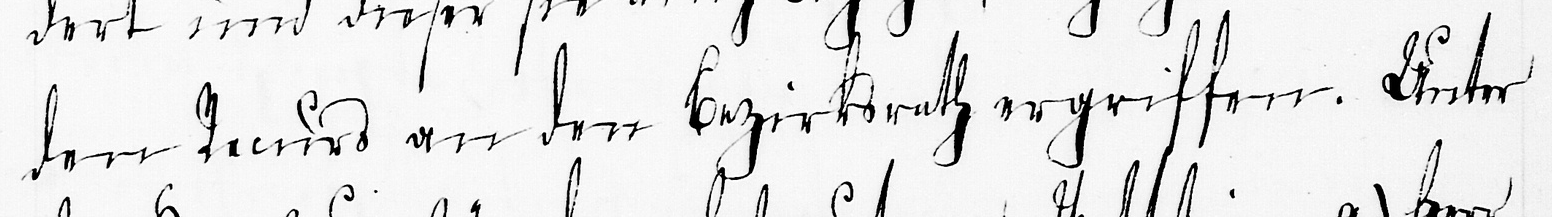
den Recurs an den Bezirksrath ergriffen. Unter
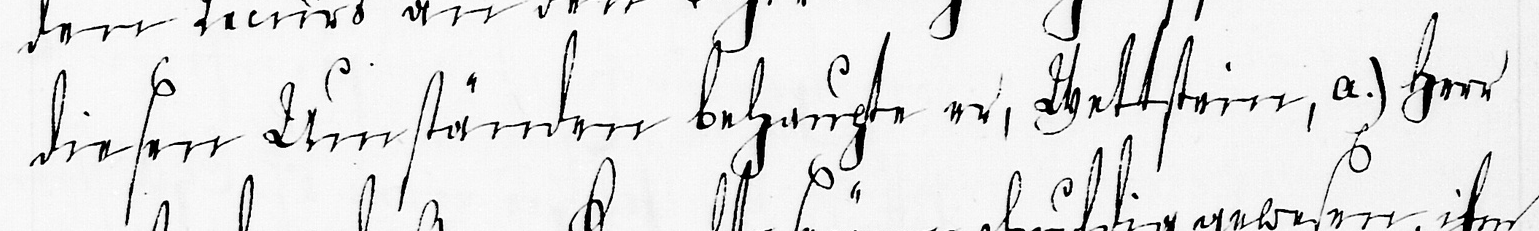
diesen Umständen behaupte er, Wettstein, a.) Herr
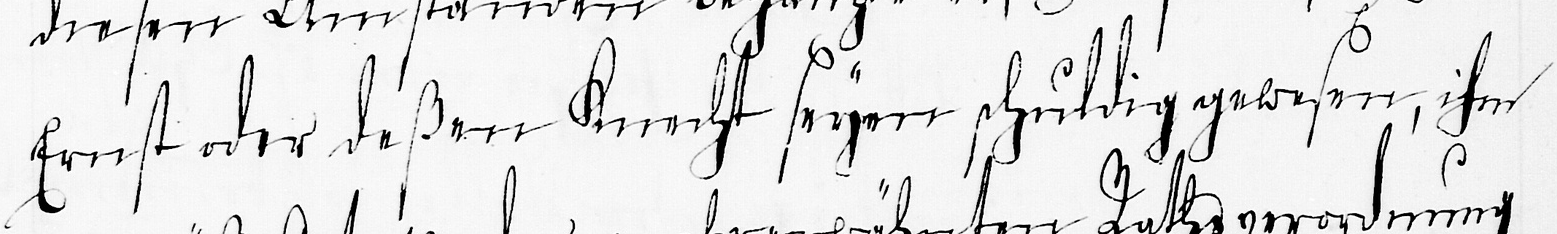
Ernst oder deßen Knecht seyen schuldig gewesen, ihm
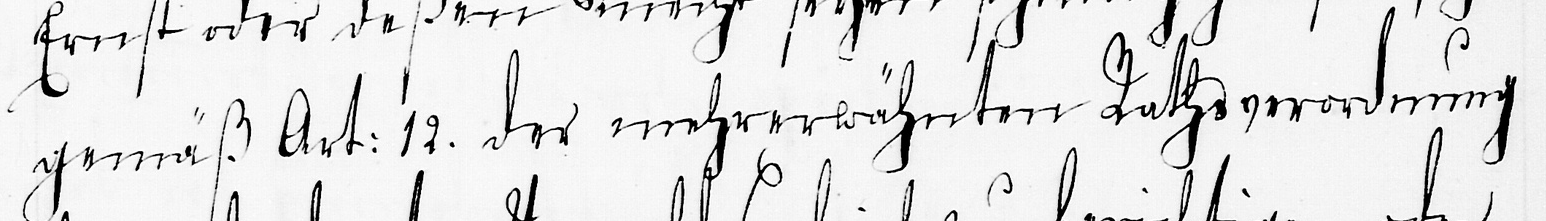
gemäß Art: 12. der mehrerwähnten Rathsverordnung
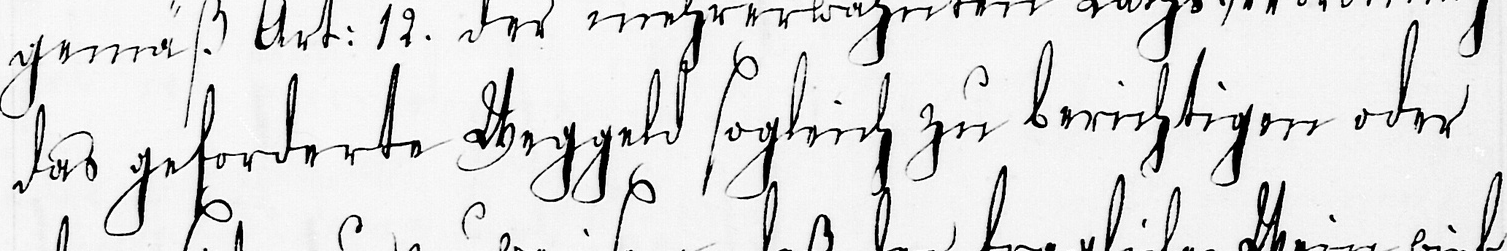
das geforderte Weggeld sogleich zu berichtigen oder
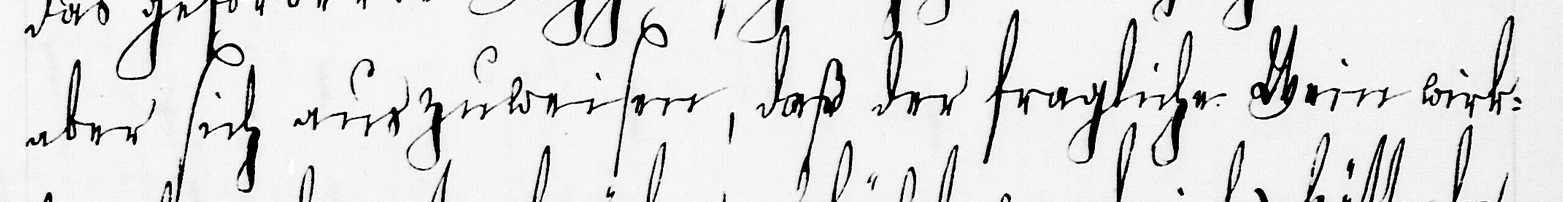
aber sich auszuweisen, daß der fragliche Wein wirk¬
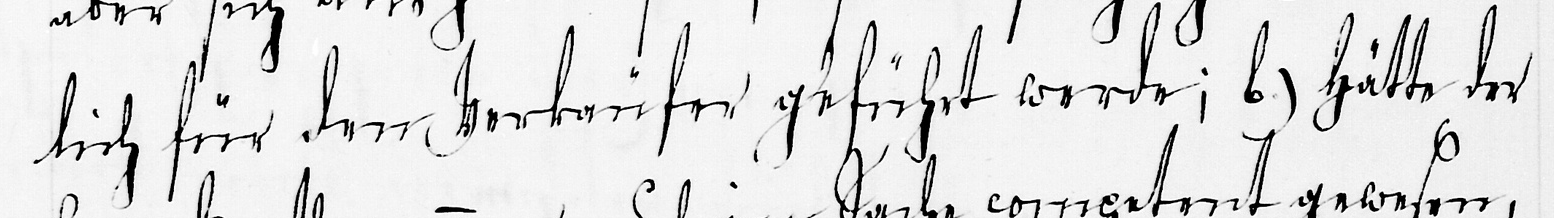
lich für den Verkäufer geführt werde; b.) hätte der
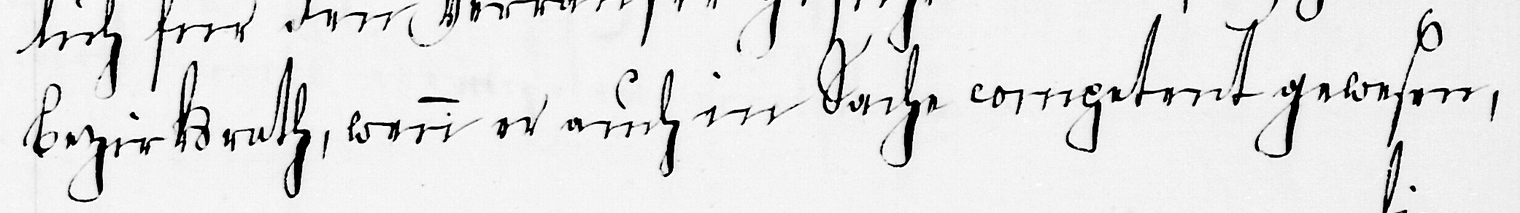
Bezirksrath, wenn er auch in Sache competent gewesen,
